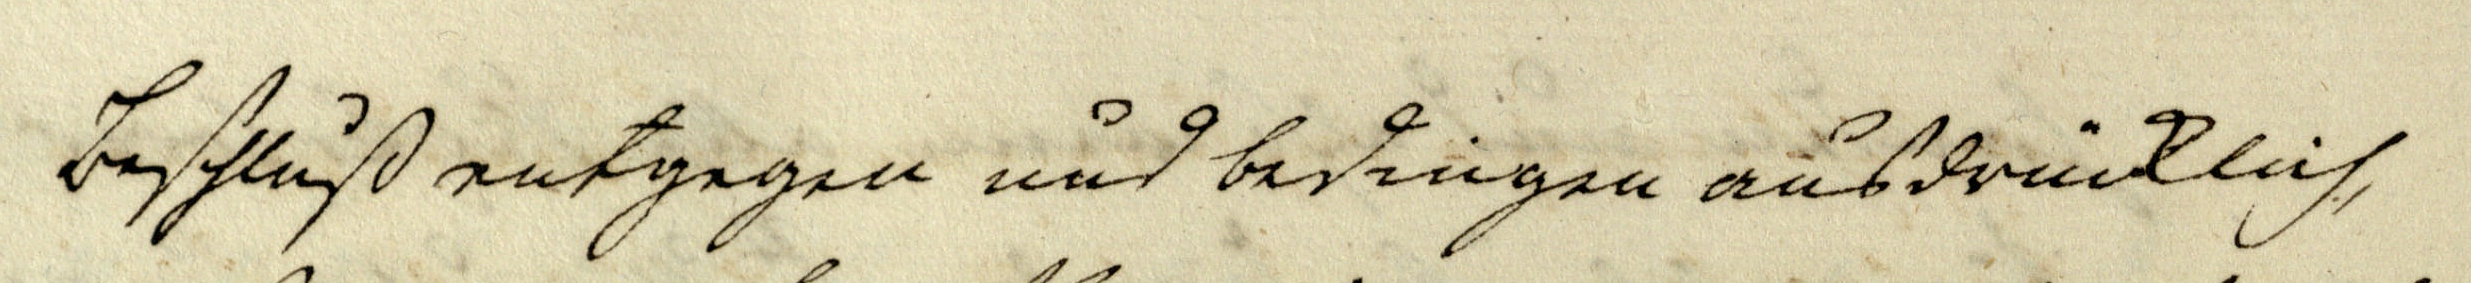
Beschluß entgegen und bedingen ausdrücklich,
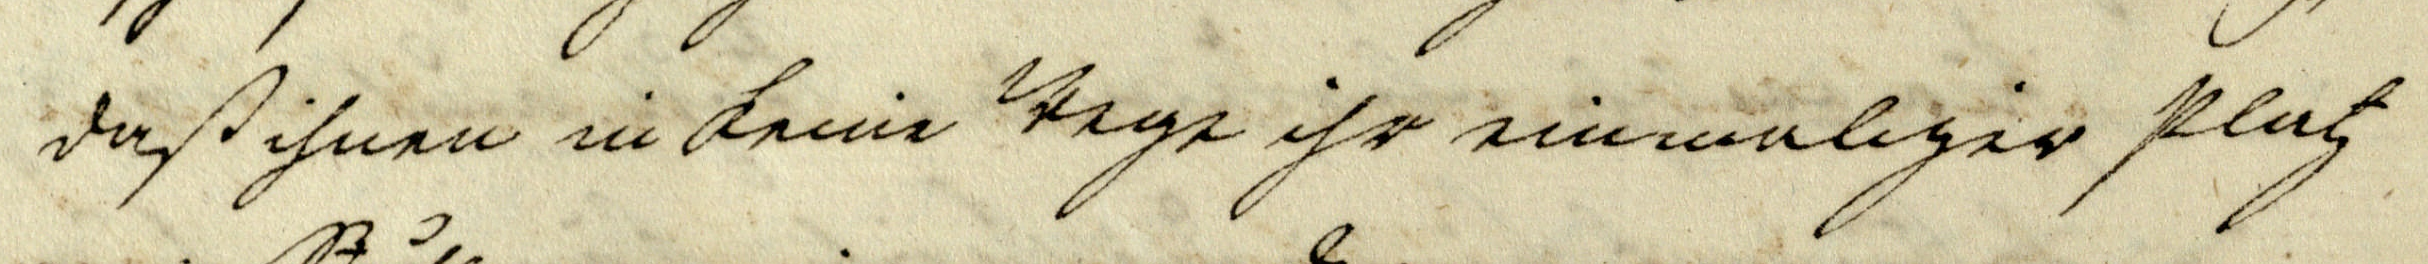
daß ihnen in keine Wege ihr einmaliger Platz
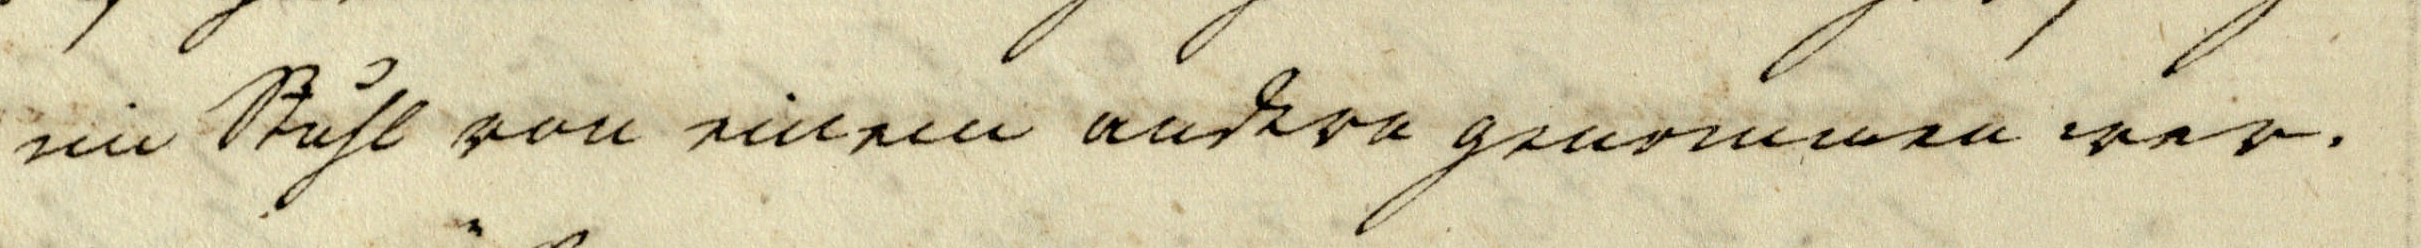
ein Stuhl von einem andern genommen wer¬
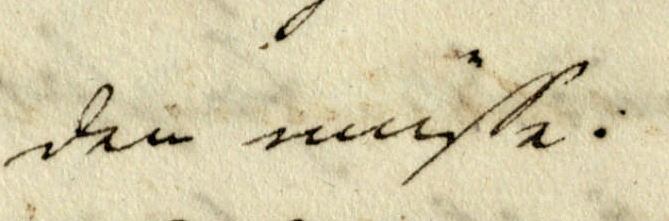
den müsse.
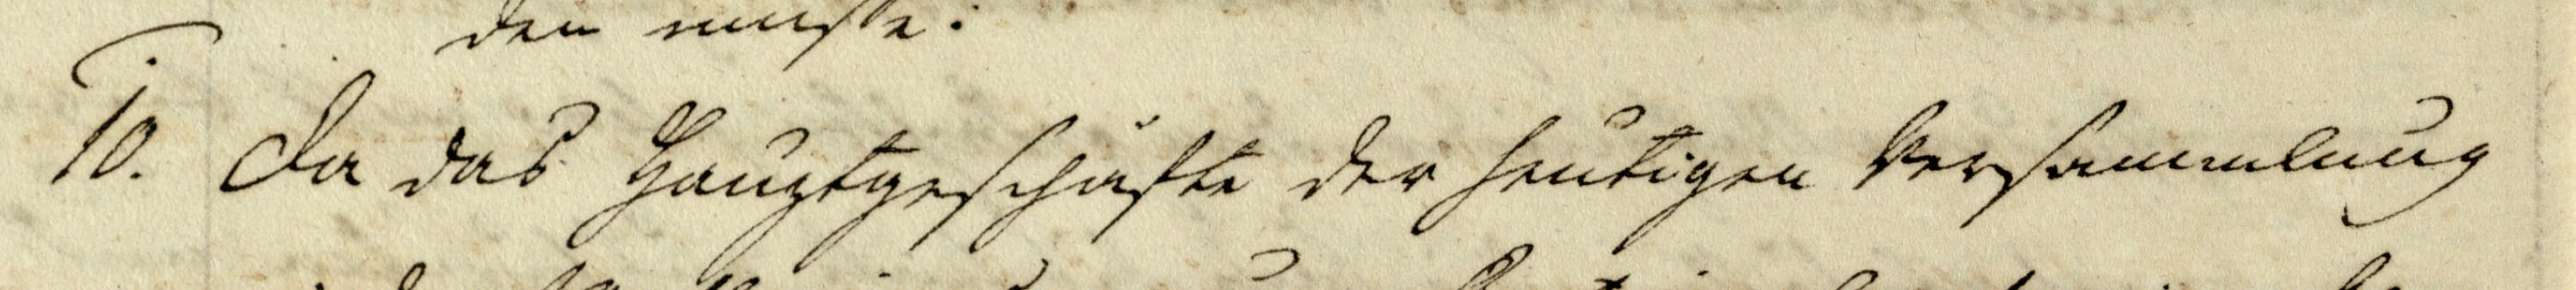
10. Da das Hauptgeschäfte der heutigen Versammlung
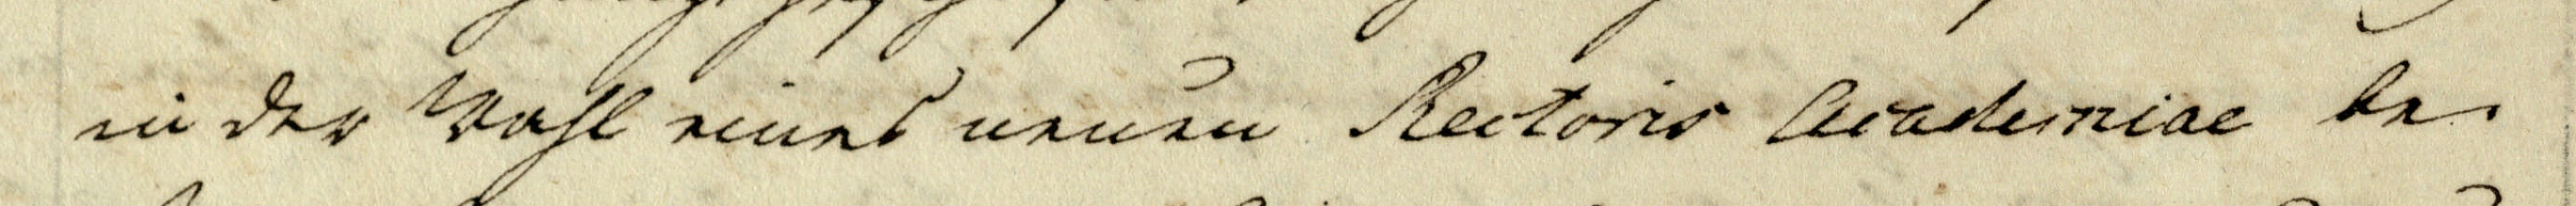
in der Wahl eines neuen Rectoris Academiae be¬
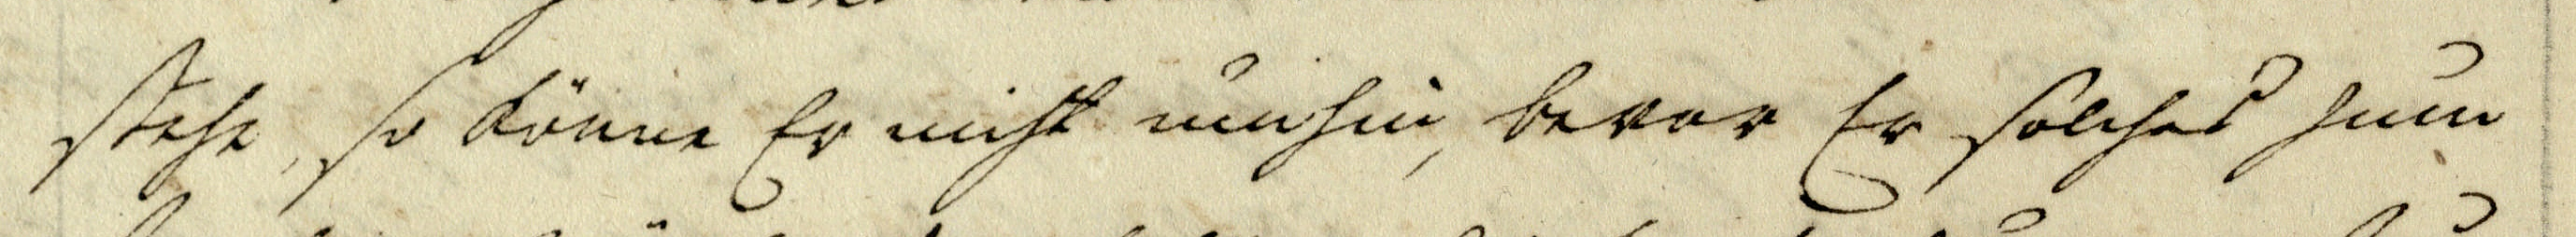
stehe, so könne Er nicht umhin, bevor Er solches zum
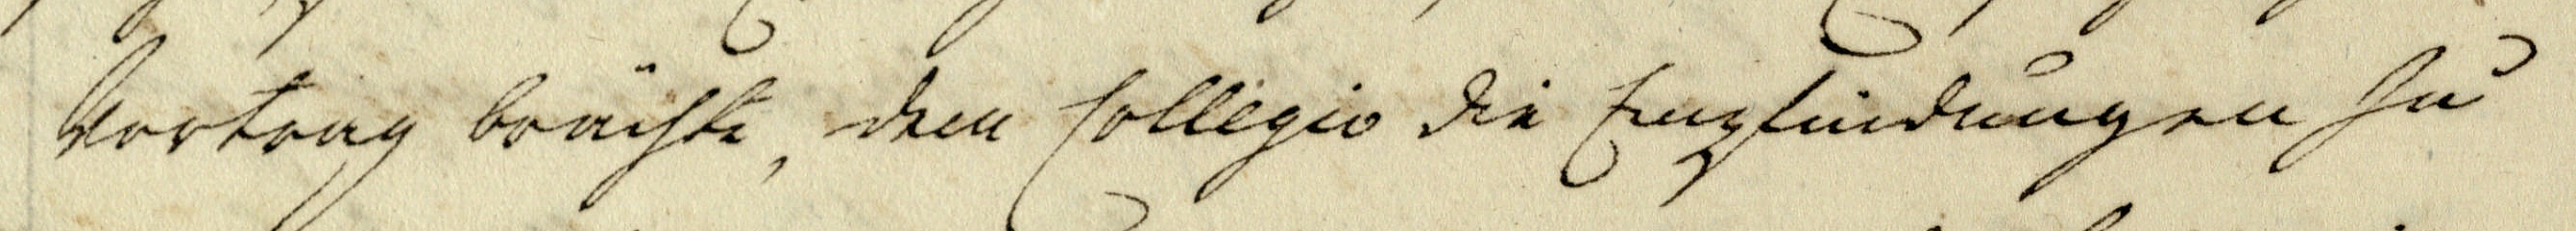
Vortrag brächte, dem Collegio die Empfindungen zu
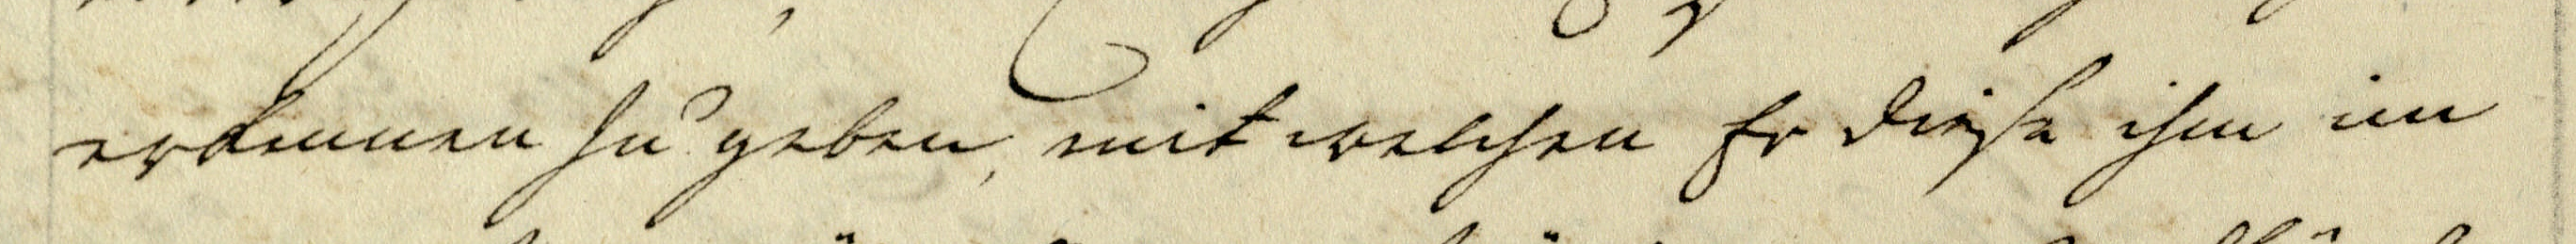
erkennen zu geben, mit welchen Er diese ihm im
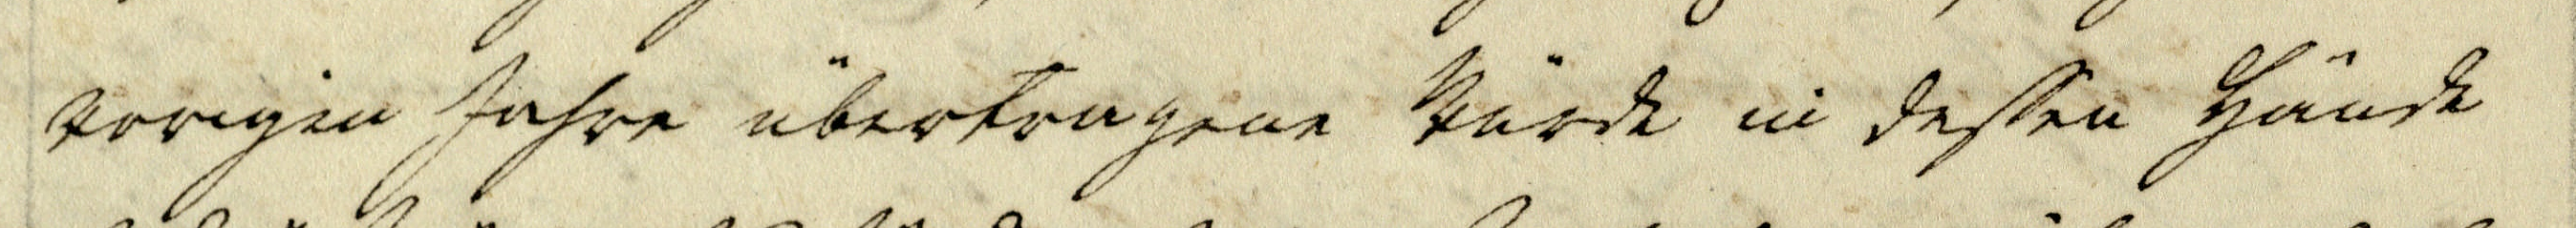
vorigen Jahre übertragene Würde in dessen Hände
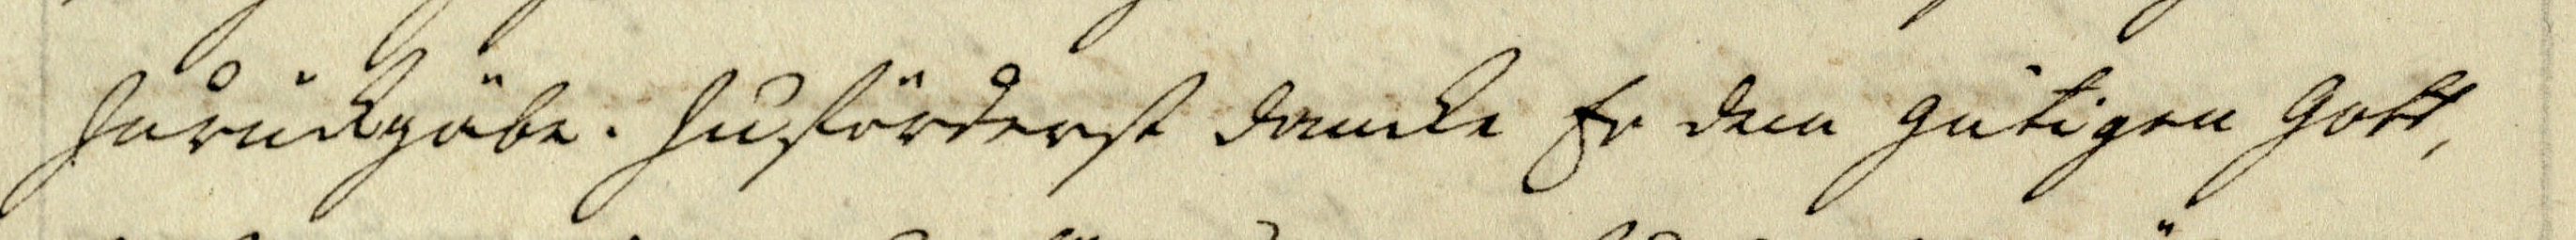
zurückgäbe. Zuförderst dancke Er dem gütigen Gott,
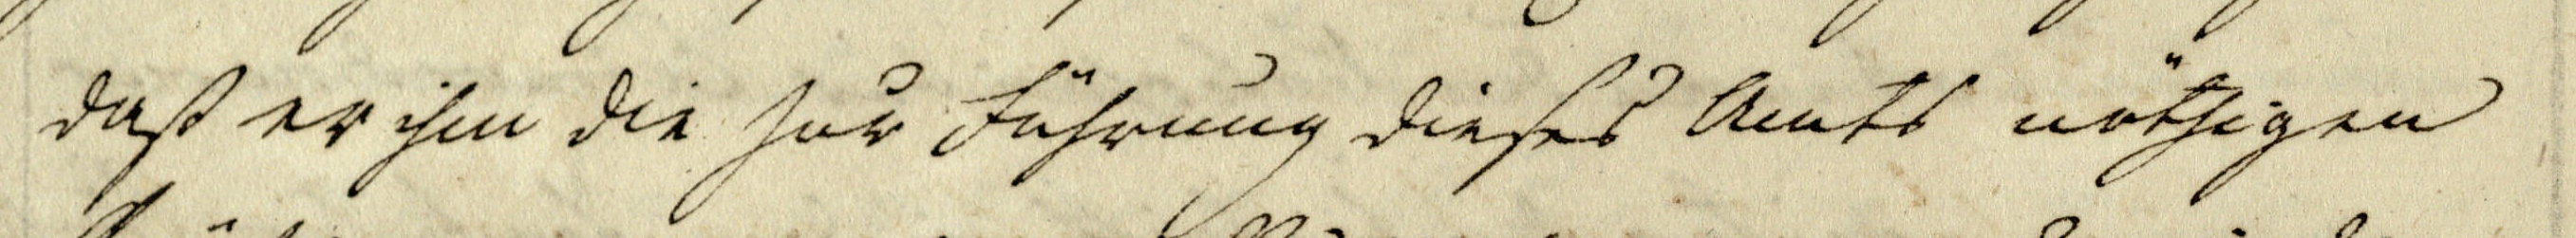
daß er ihm die zur Führung dieses Amts nöthigen
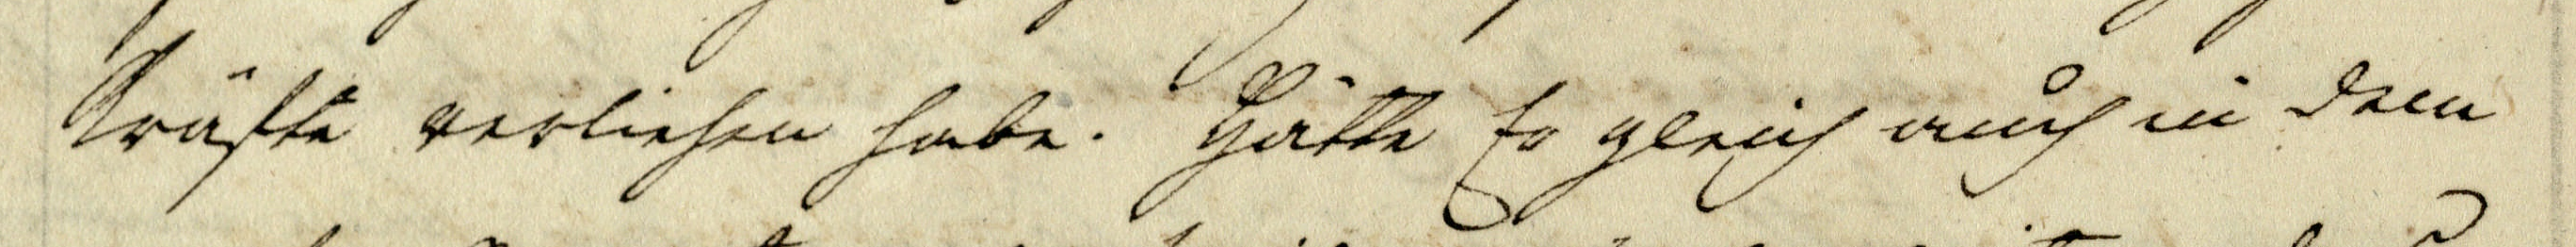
Kräfte verliehen habe. Hätten Er gleich auch in dem
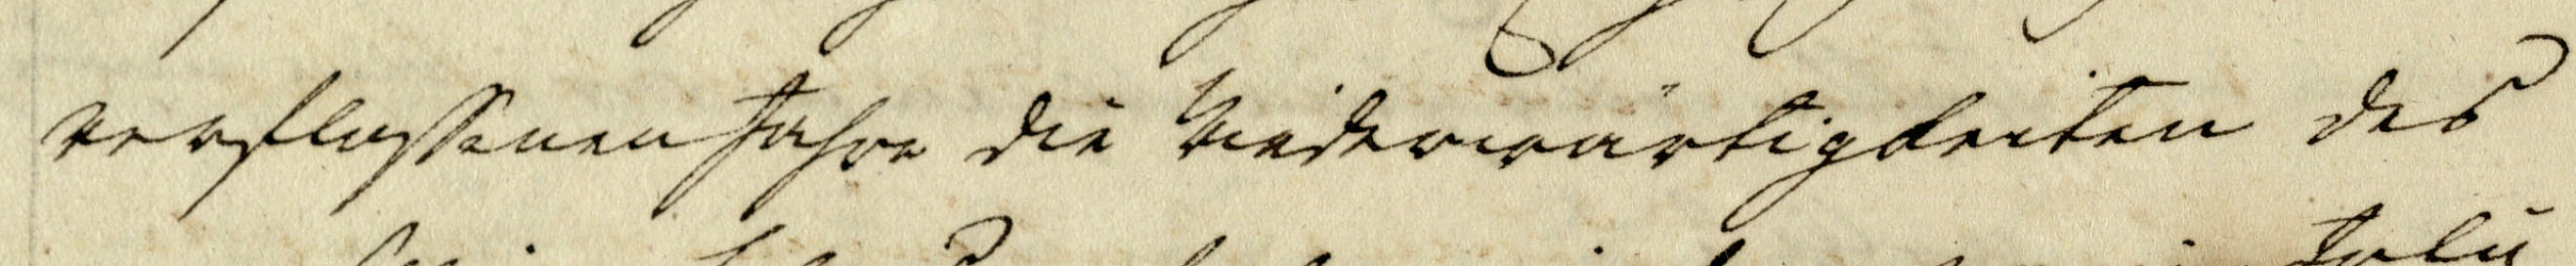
verflossenen Jahre die Wiederwärtigkeiten des
